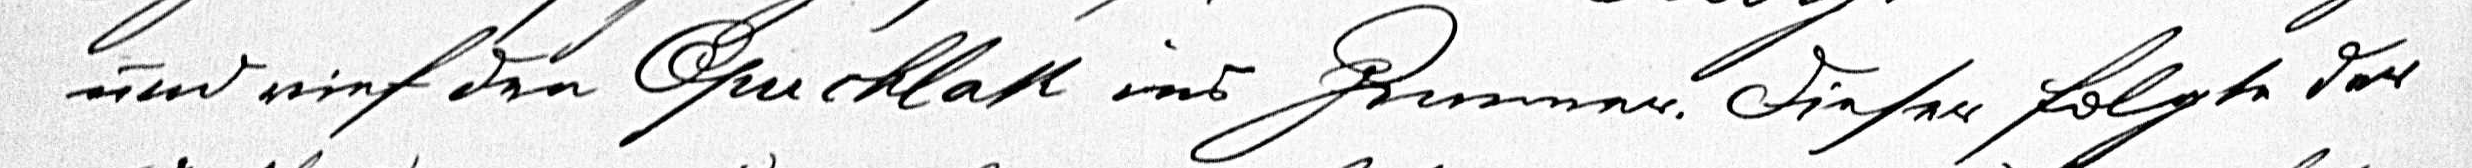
und rief den Opuchlak ins Zimmer. Dieser folgte der
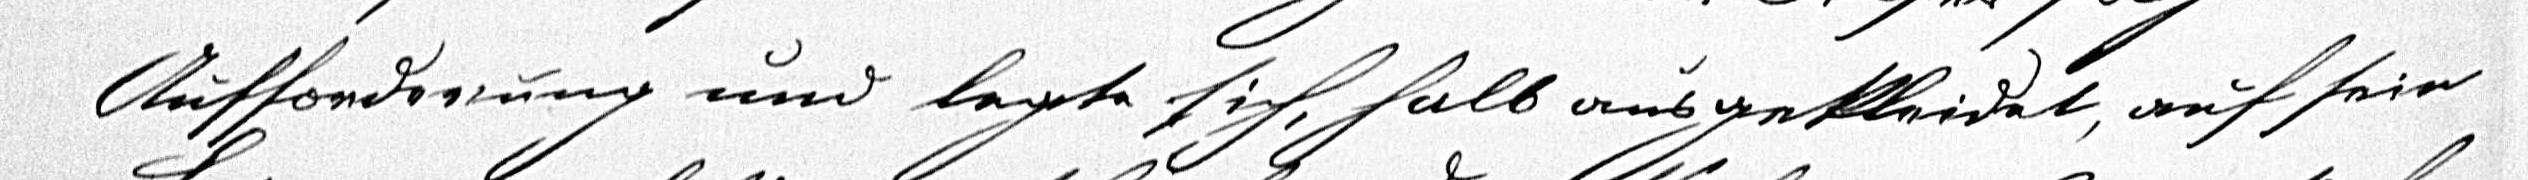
Aufforderung und legte sich, halb ausgekleidet, auf sein
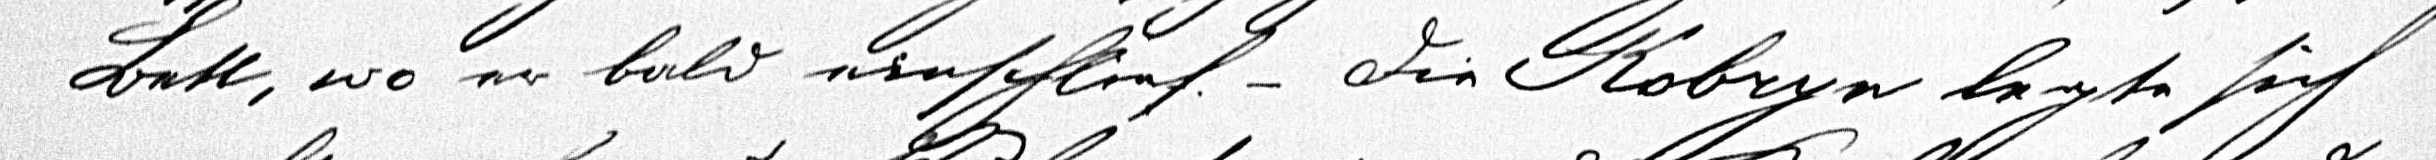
Bett, wo er bald einschlief. – Die Kobryn legte sich
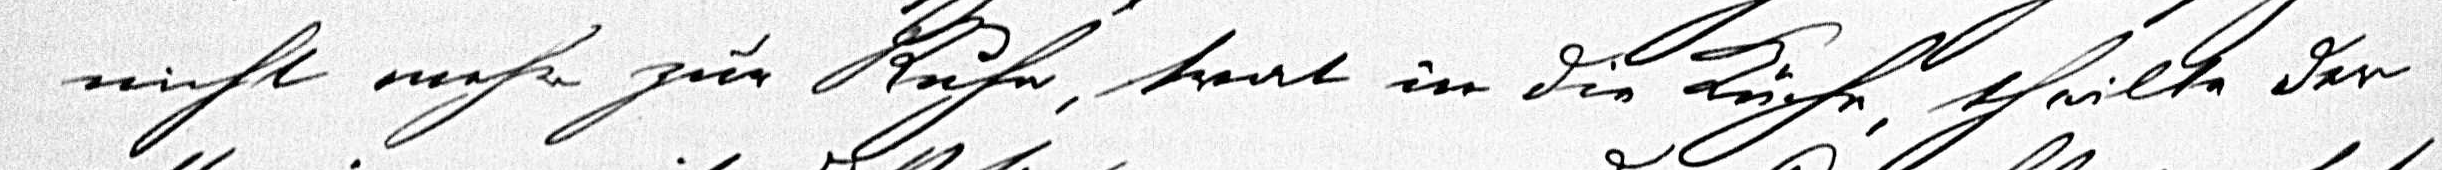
nicht mehr zur Ruhe, trat in die Küche, theilte der
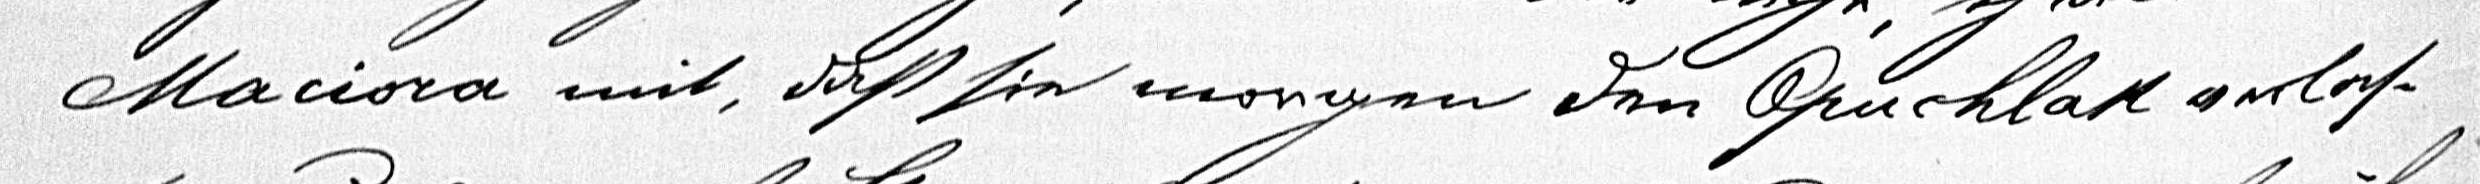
Maciora mit, daß sie morgen den Opuchlak erlas¬
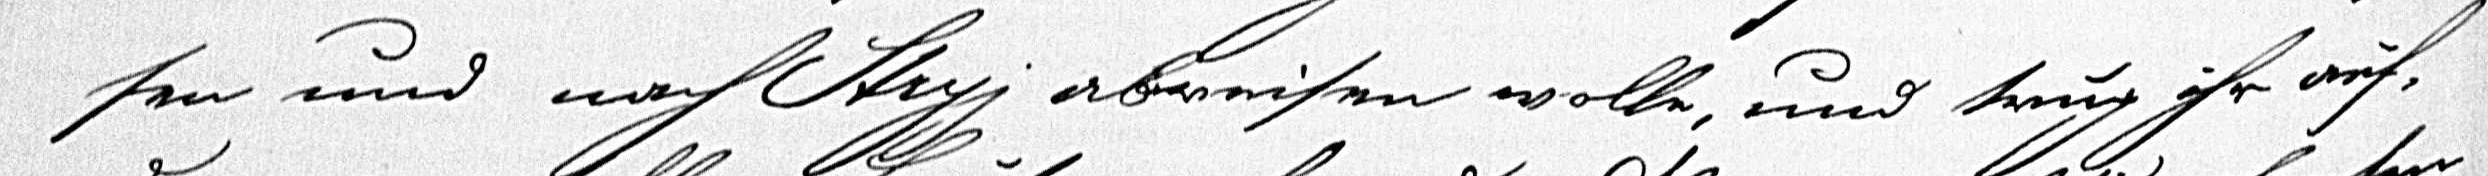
sen und nach Stryj abreisen wolle, und trug ihr auf,
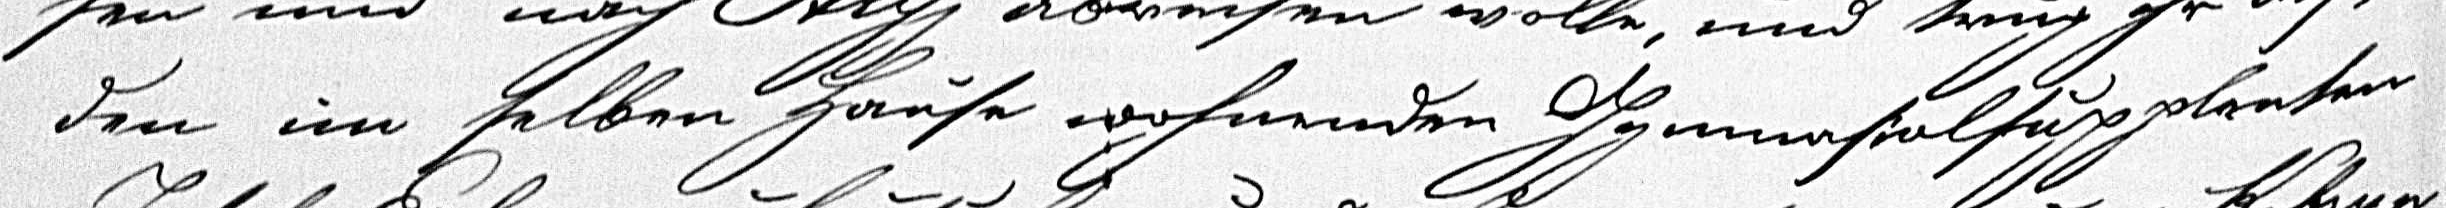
den im selben Hause wohnenden Gymnasialsupplenten
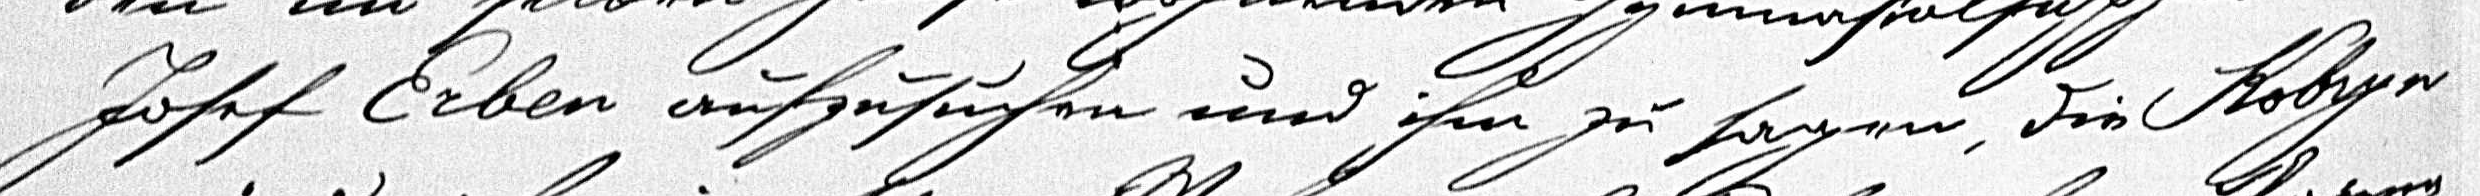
Josef Erben aufzusuchen und ihm zu sagen, die Kobryn
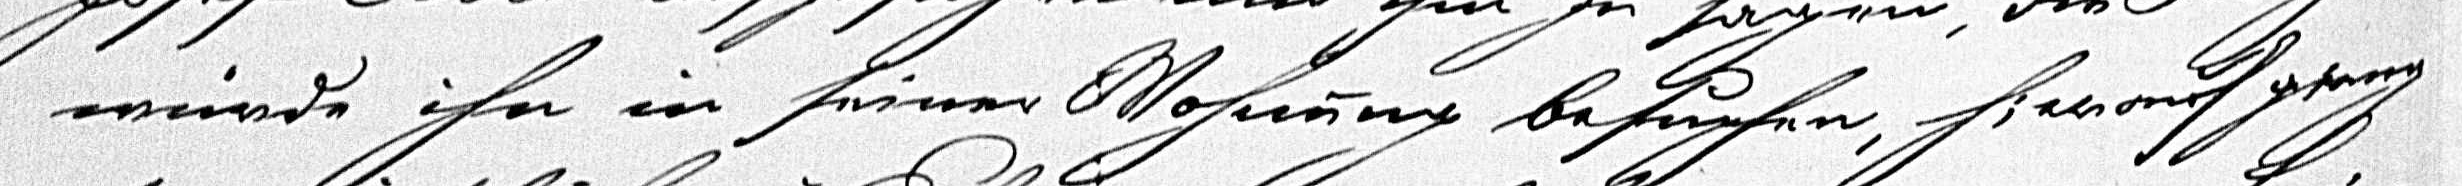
wurde ihn in seiner Wohnung besuchen, hierauf gieng
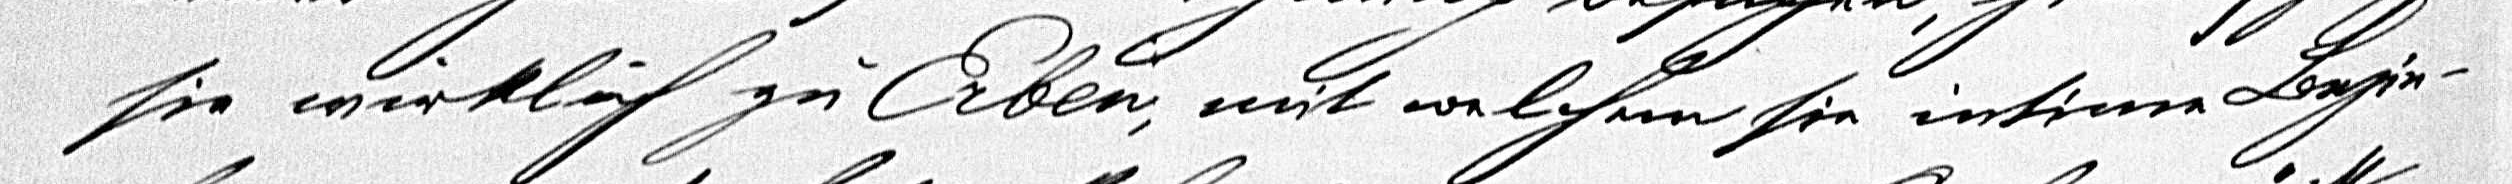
sie wirklich zu Erben, mit welchem sie intime Bezie¬
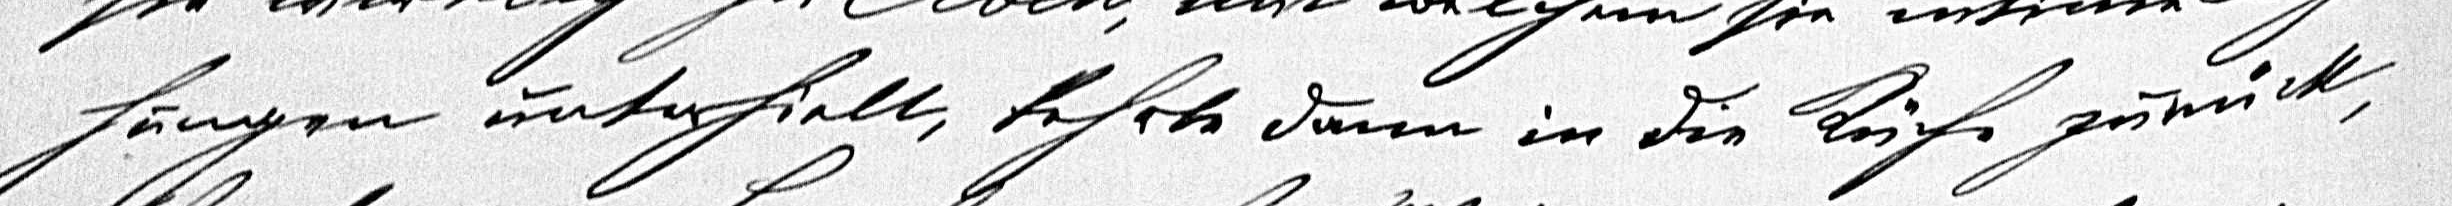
hungen unterhielt, kehrte dann in die Küche zurück,
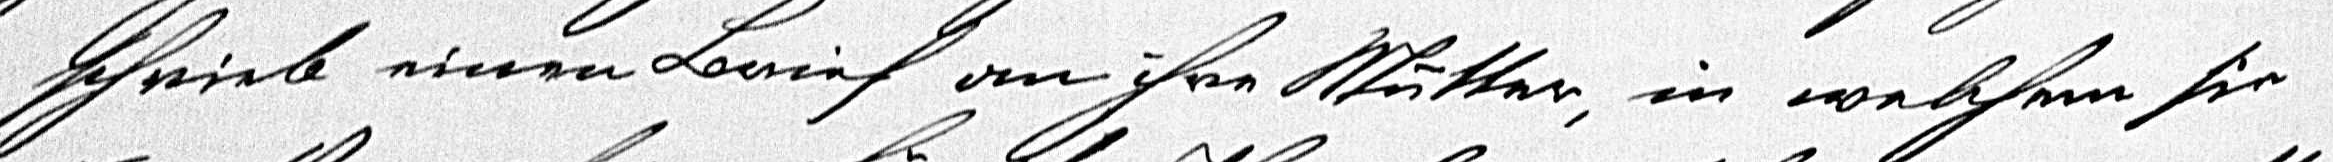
schrieb einen Brief an ihre Mutter, in welchem sie
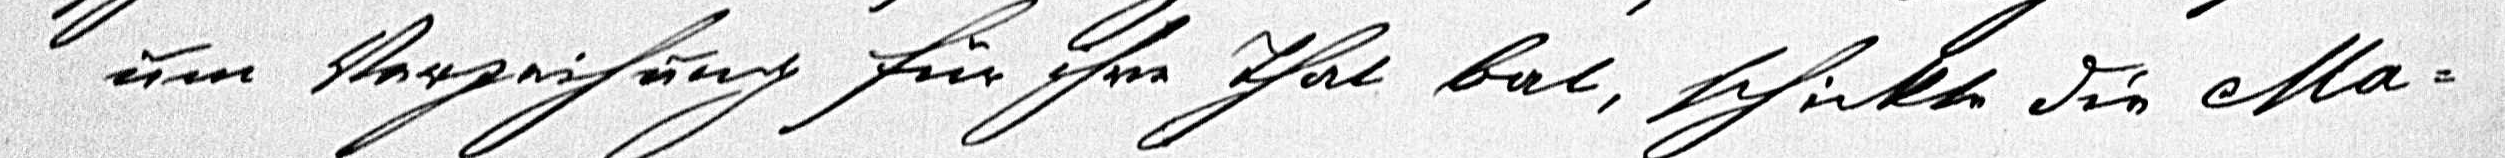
um Verzeihung für ihre That bat, schickte die Ma¬
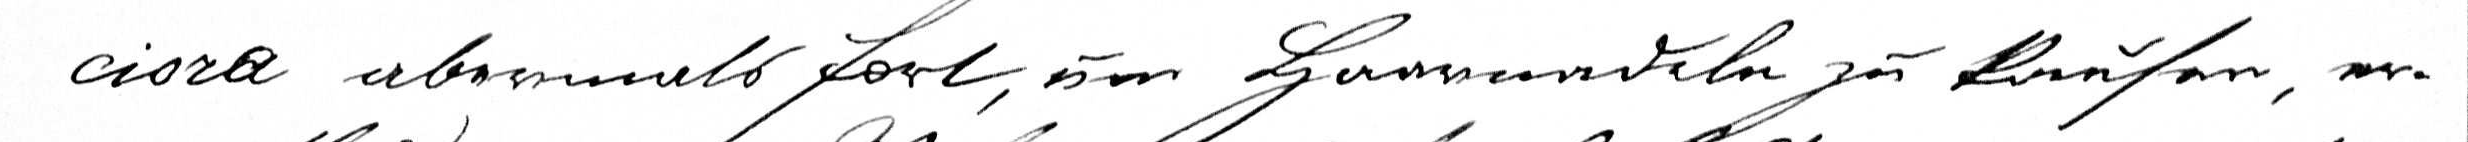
cisza abermals fort, um Haarnadeln zu kaufen, er¬
